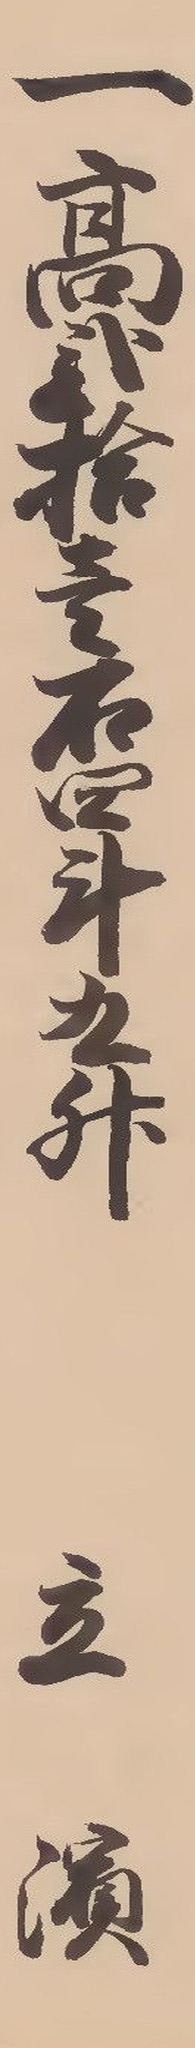一高弐拾壱石四斗九升立浜
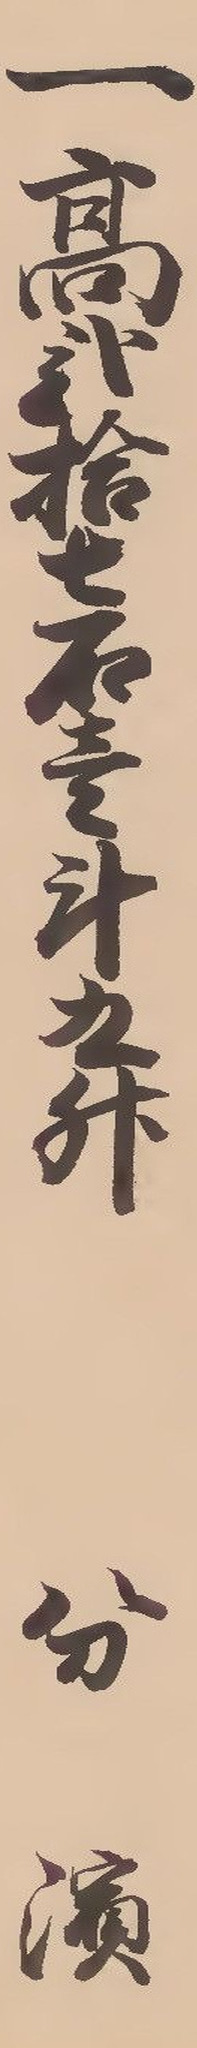一高弐拾七石壱斗九升分浜
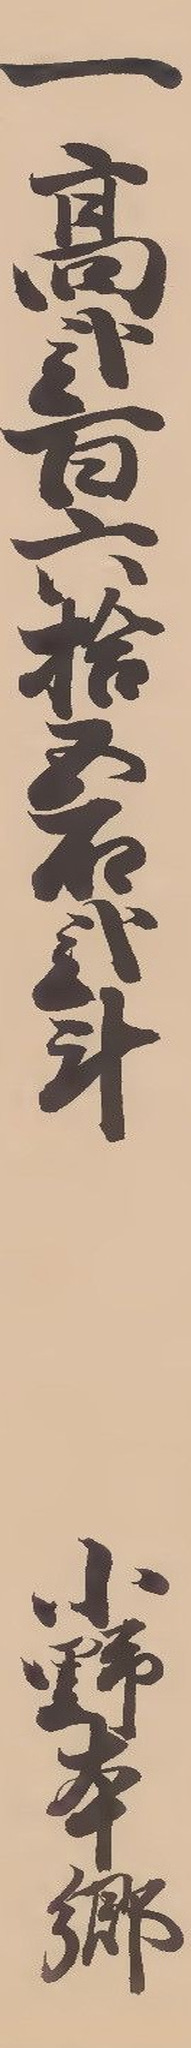一高弐百六拾五石弐斗小野本郷
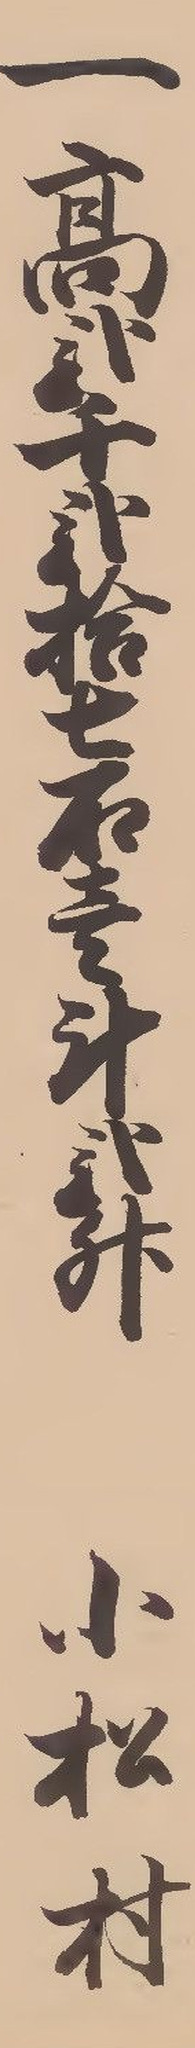一高弐千弐拾七石壱斗弐升小松村
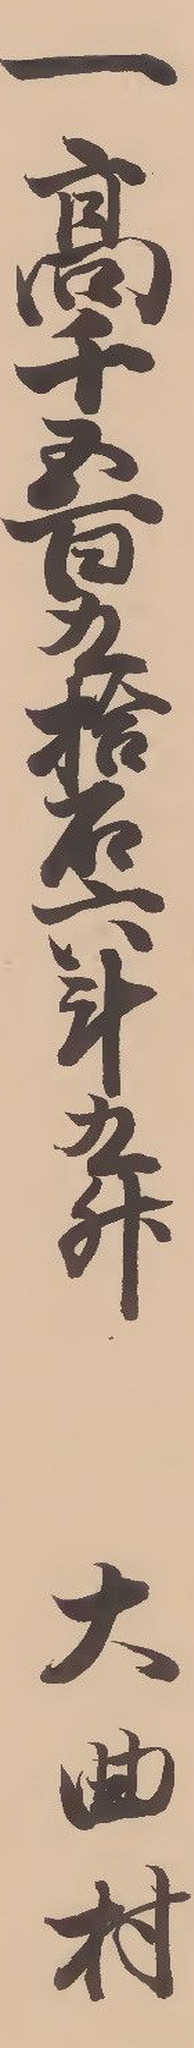一高千五百九拾石六斗九升大曲村
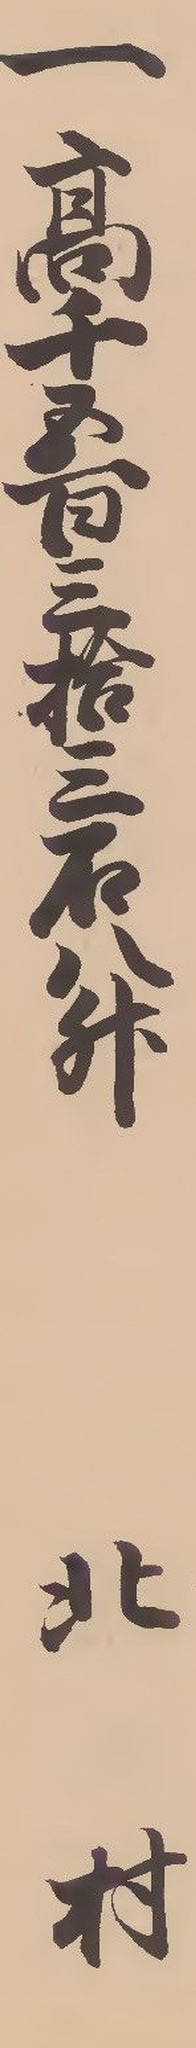一高千五百三拾三石八升北村

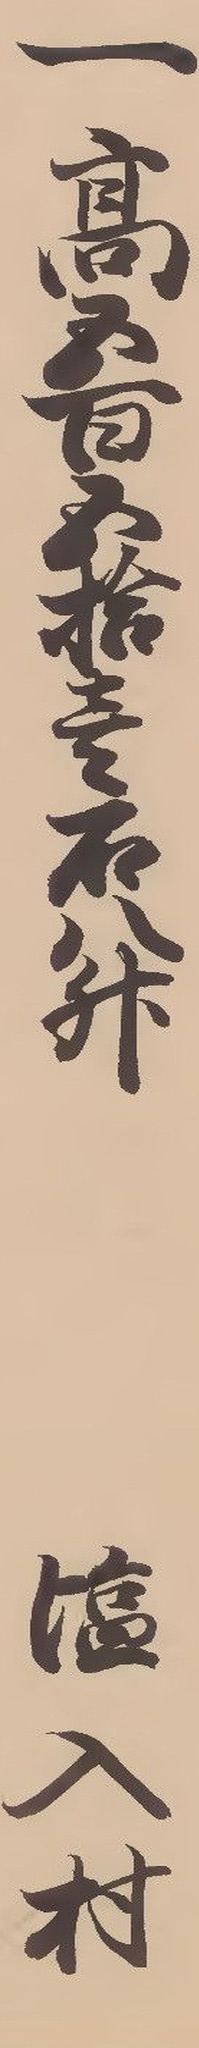一高五百五拾壱石八升塩入村
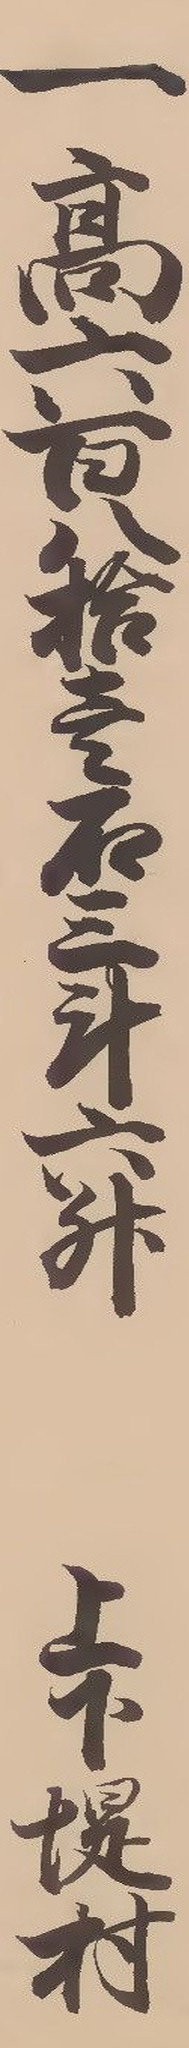一高六百八拾壱石三斗六升上下堤村
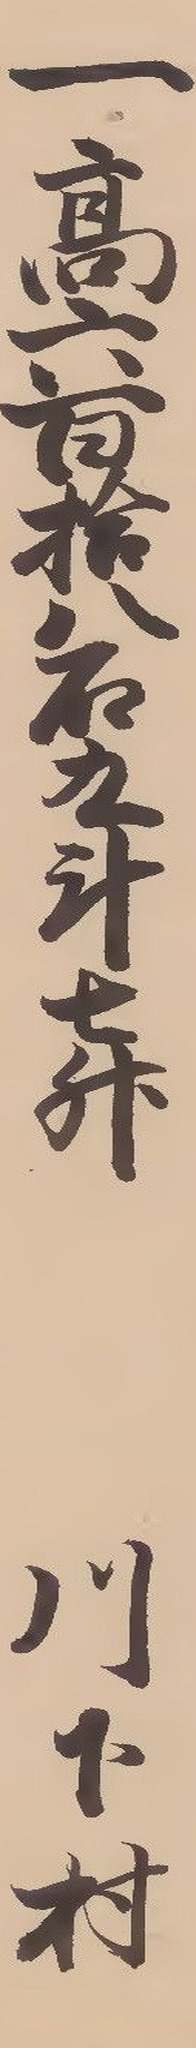一高六百拾八石九斗七升川下村
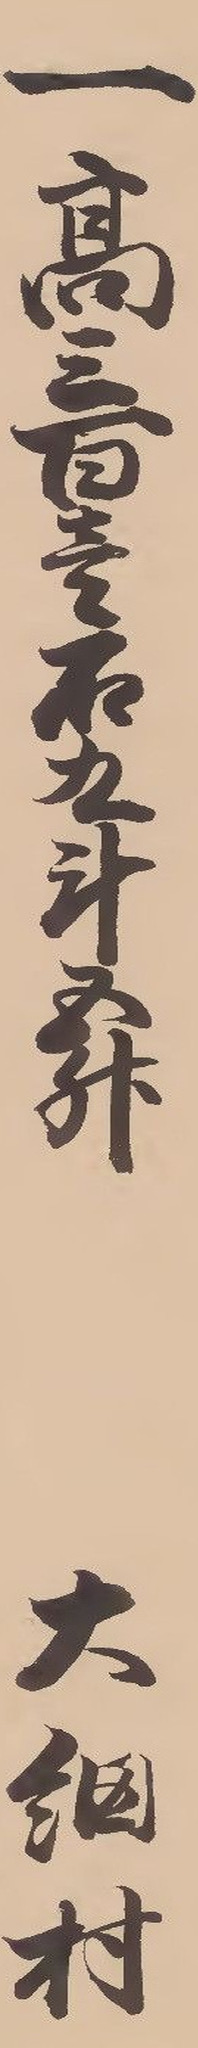一高三百壱石九斗五升大網村
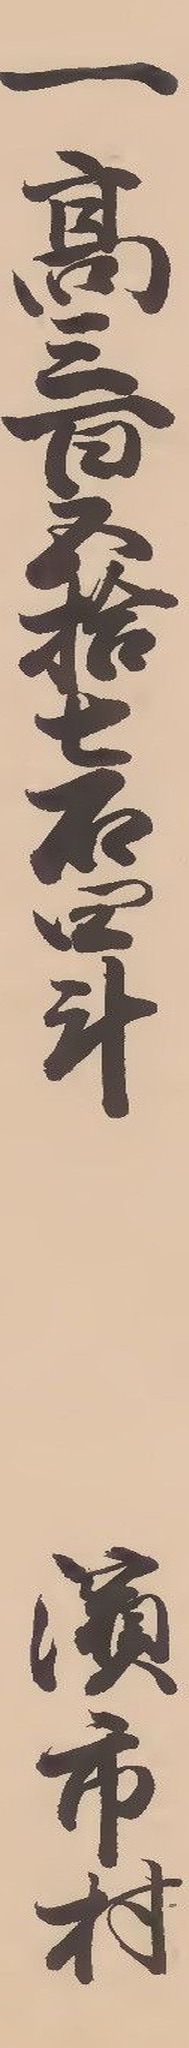一高三百五拾七石四斗浜市村
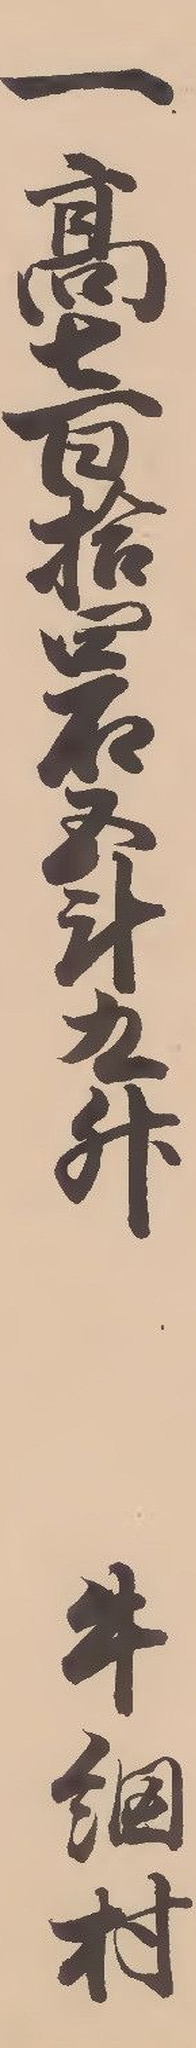一高七百拾四石五斗九升牛網村
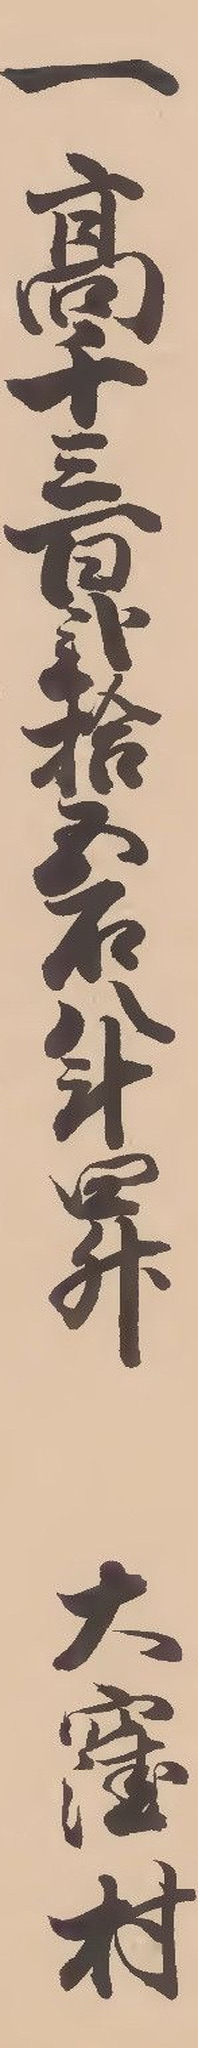一高千三百弐拾五石八斗四升大窪村
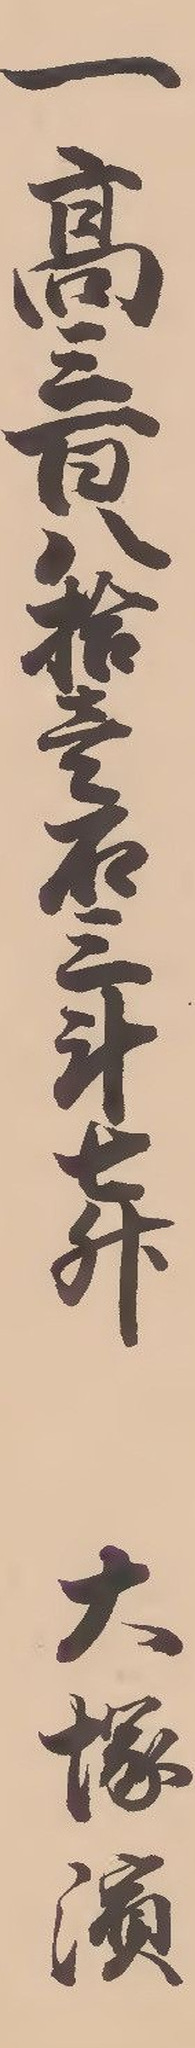一高三百八拾壱石三斗七升大塚浜

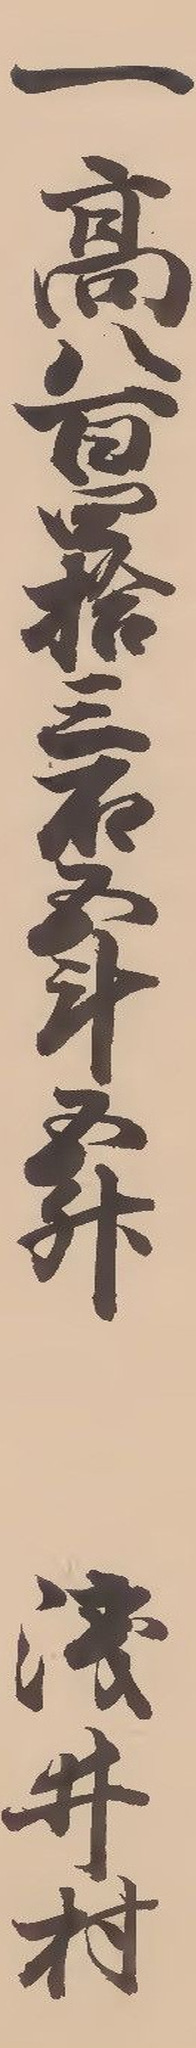一高八百四拾三石五斗五升浅井村
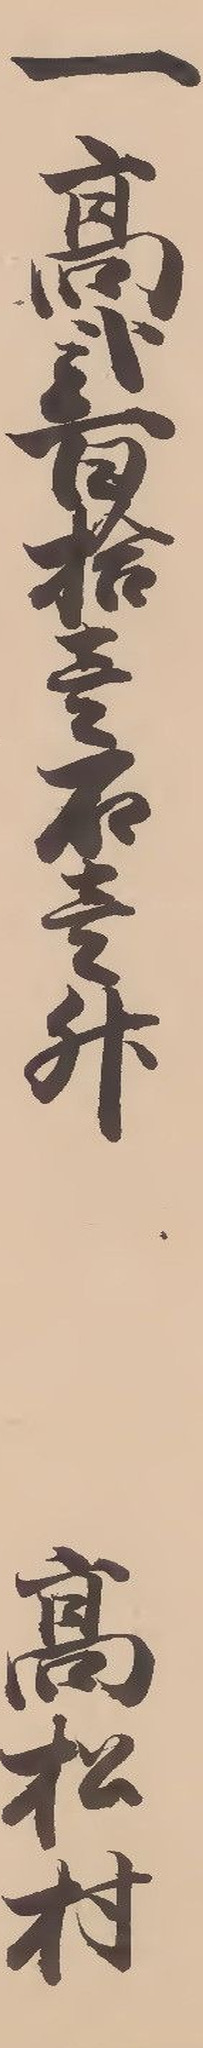一高弐百拾壱石壱升高松村
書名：陸奥国郷帳　５
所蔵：国立公文書館 National Archives of Japan
